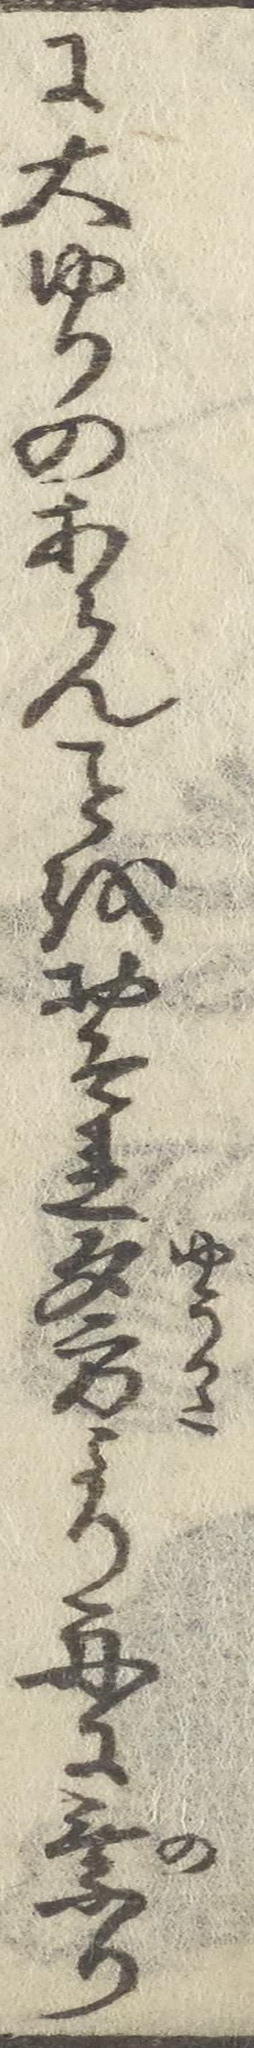に大ゆりのあらんことをおそれ夕方より舟に乗り

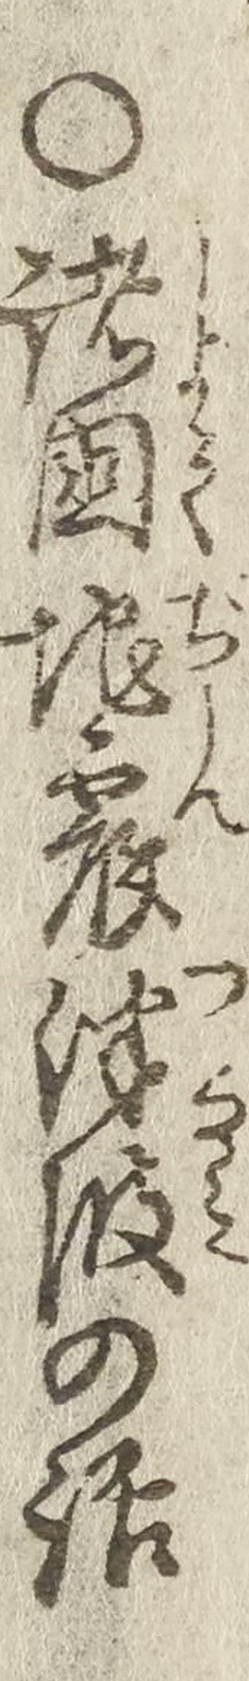○諸国地震津波の話
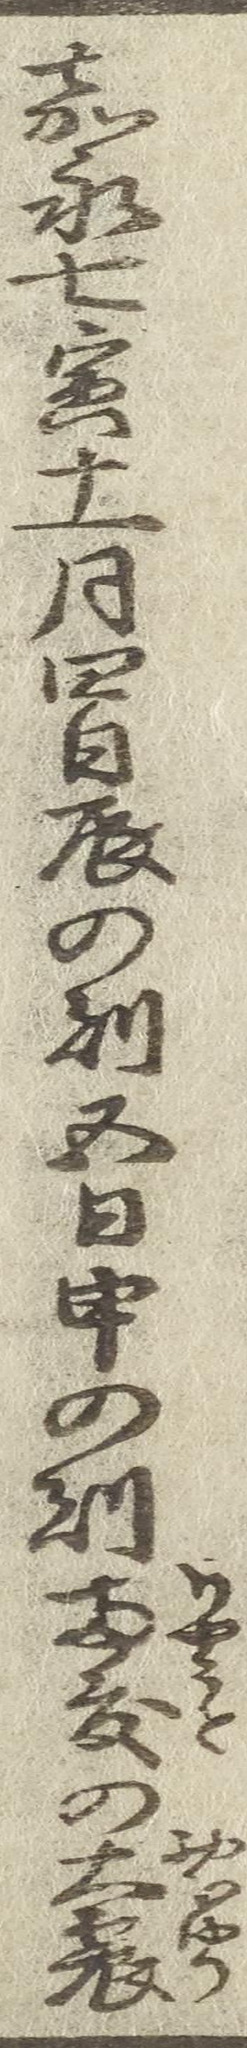嘉永七寅十一月四日辰の刻五日申の刻両度の大震
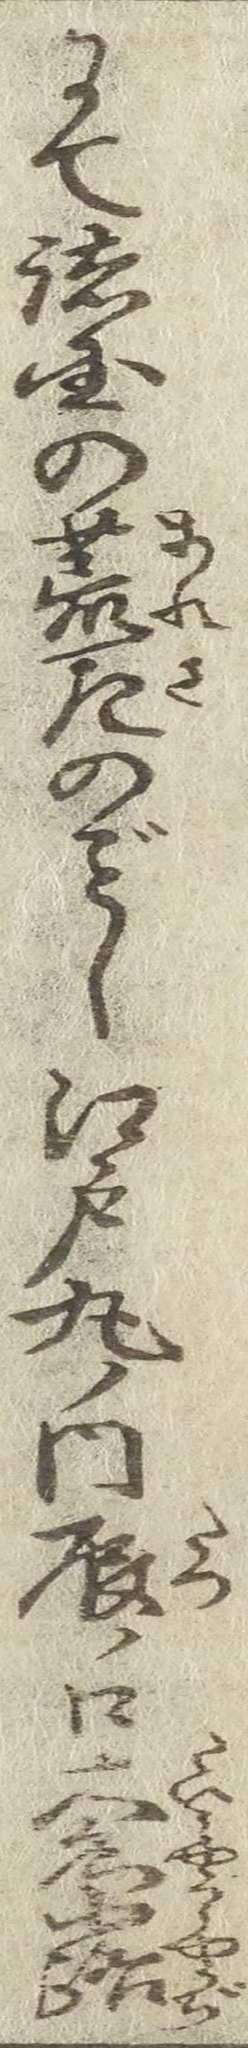にて諸国の荒左のごとし江戸丸ノ内辰ノ口大名小路
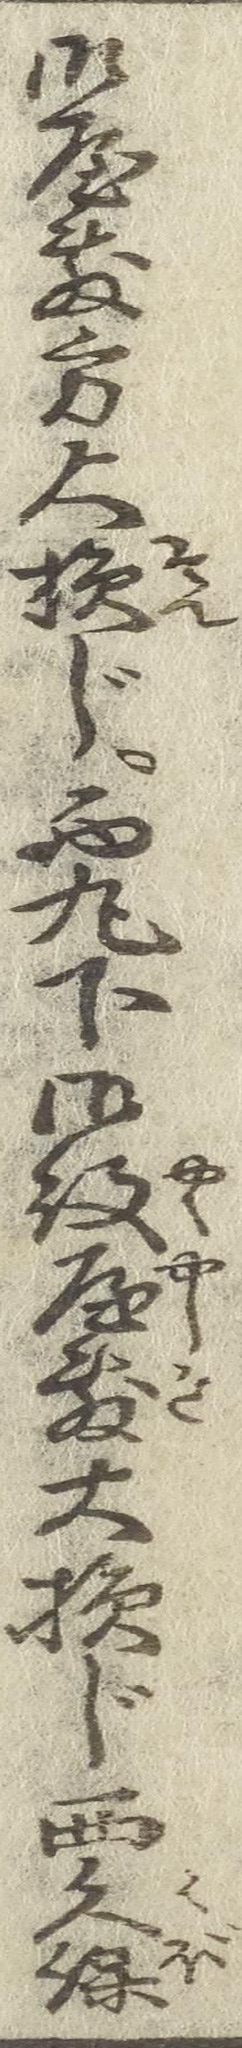御屋敷方大損じ。西丸下御役屋敷大損じ西久保

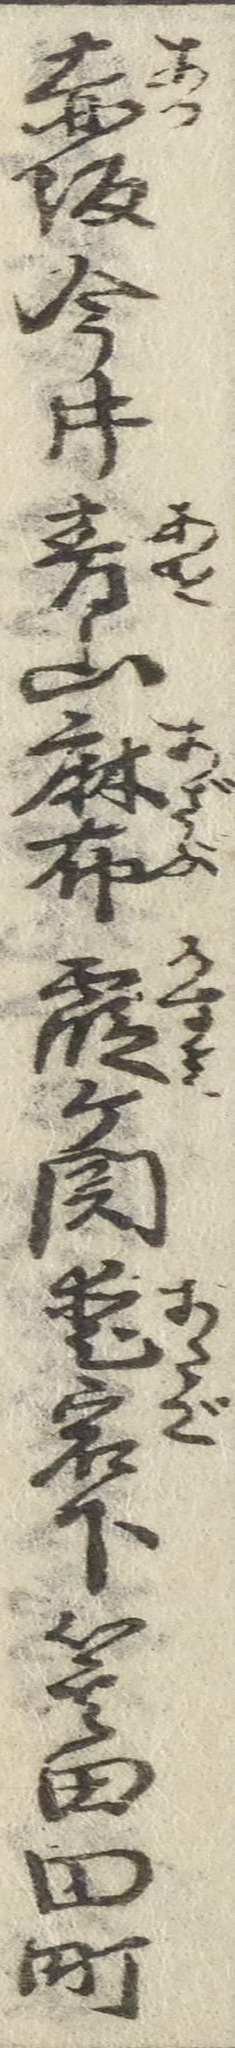赤坂今井青山麻布霞ヶ関愛宕下箕田田町
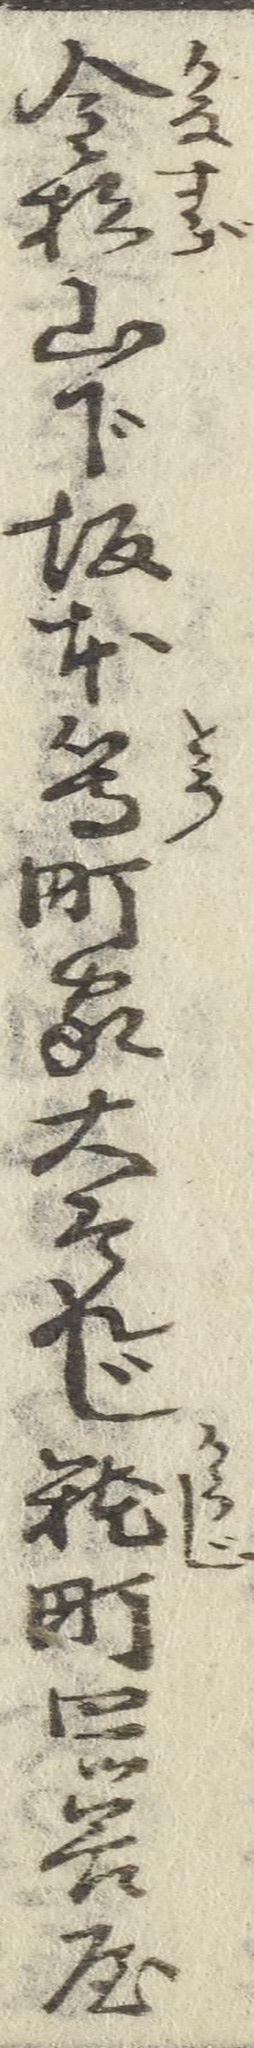金杉山下坂本等町家大そんじ麹町四ツ谷屋
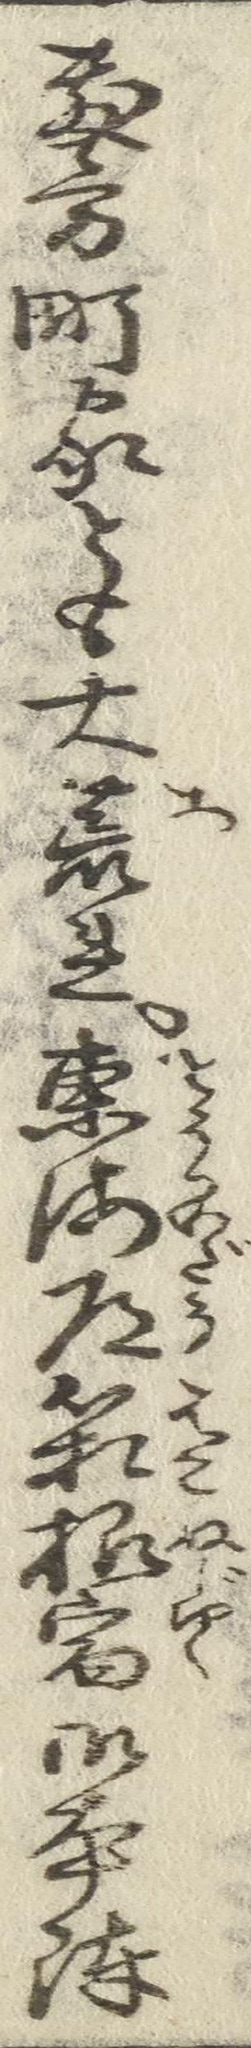敷方町家とも大荒れ。東海道箱根宿御本陣
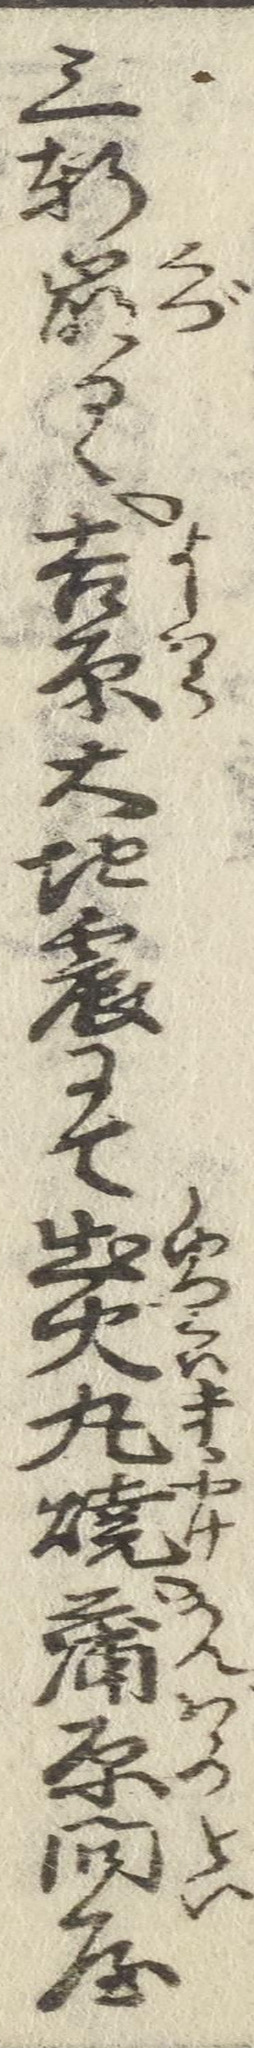三軒崩るゝ。吉原大地震にて出火丸焼。蒲原問屋
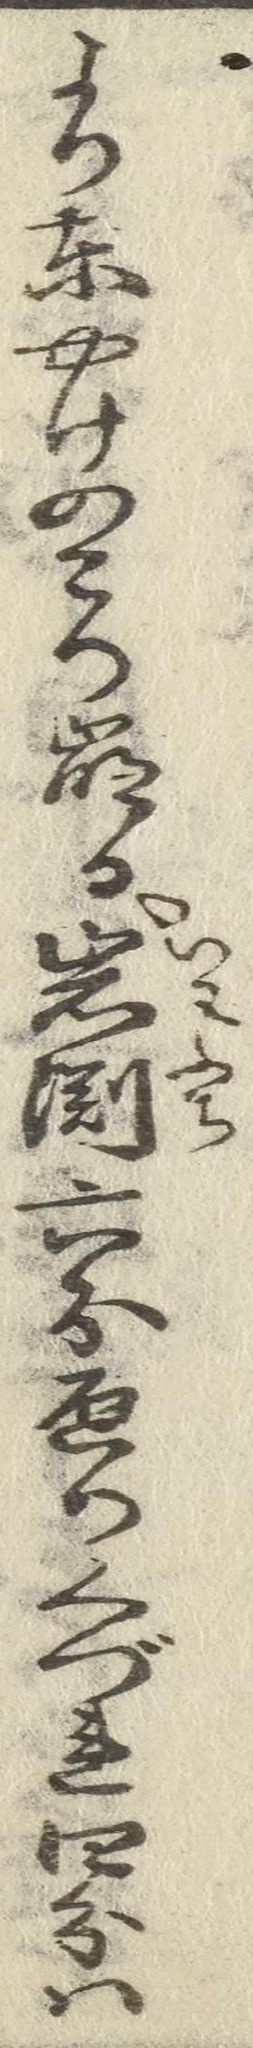より東やけのこり崩る。岩渕六分辺りくづれ四分は
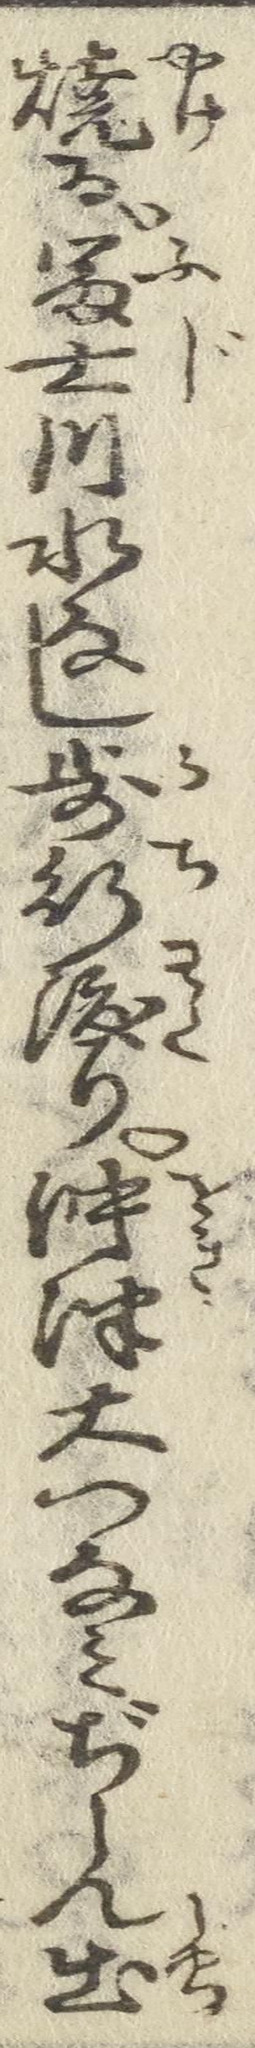焼る。富士川水なし歩行渡り。沖津大つなみぢしん出
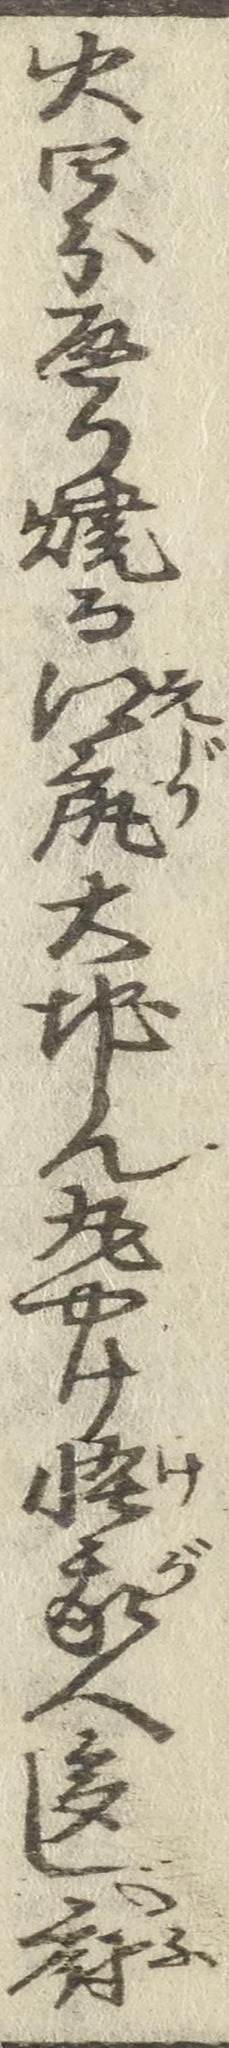火四分辺り焼る江尻大地しん丸やけ怪我人多し。府
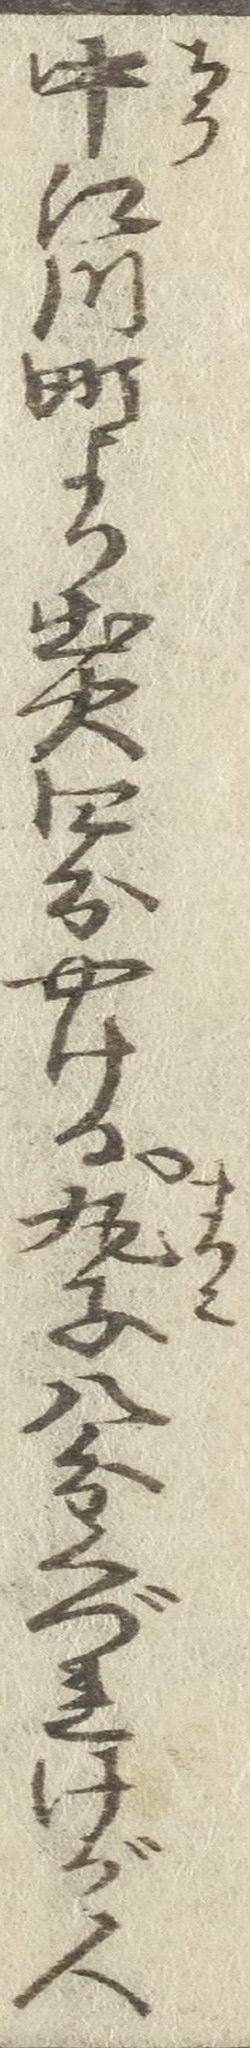中江川町より出火四分やける。丸子八分くづれけが人
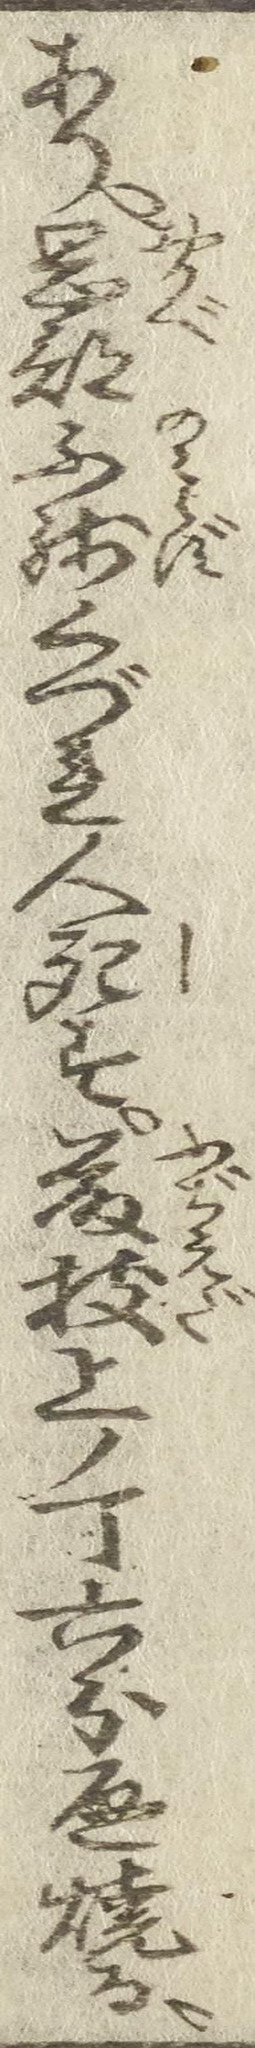あり。岡部不残くづれ人死す。藤枝上ノ丁六分辺焼る。
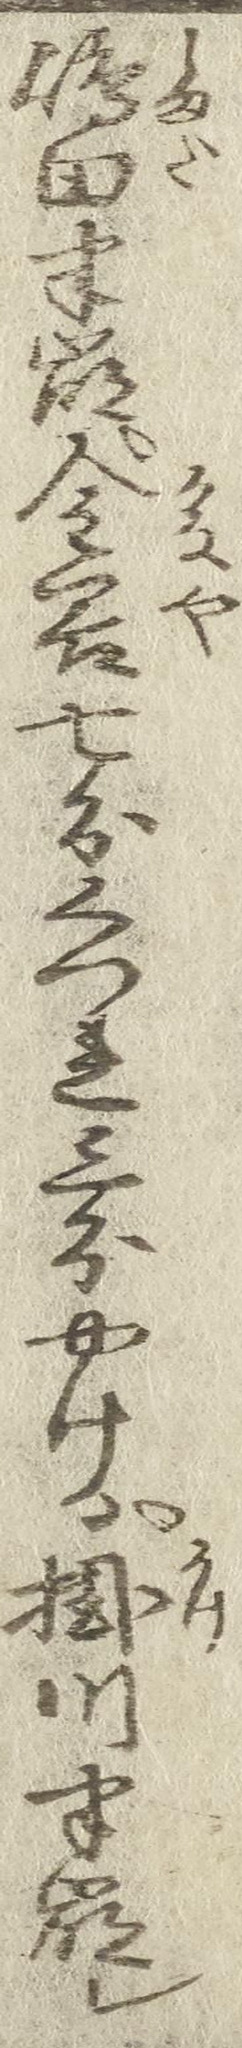嶋田半崩。金谷七分くつれ三分やける。掛川半崩れ
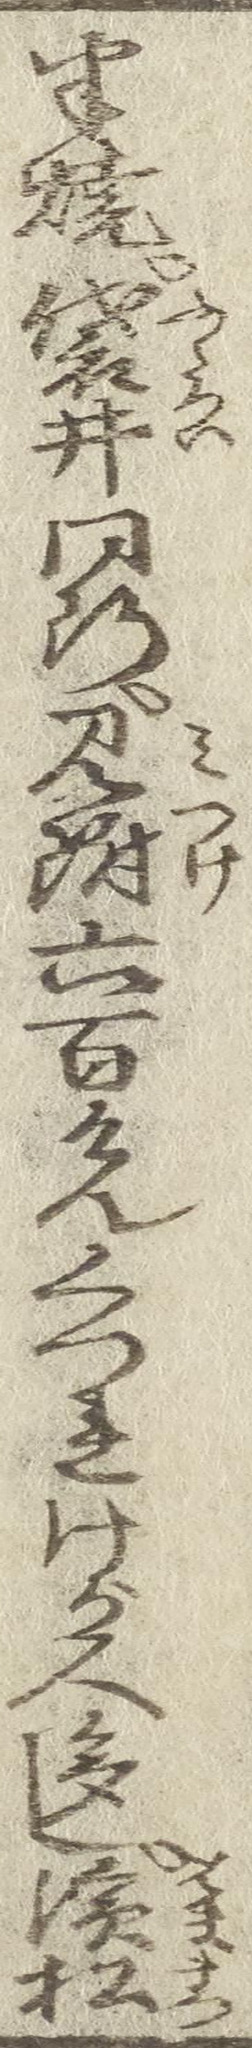半焼。袋井同断。見附六百けんくつれけが人多し。浜松
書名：大地震　津涛乃奇談　第二集
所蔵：東京大学地震研究所図書室 Earthquake Research Institute Library, The University of Tokyo, JAPAN
